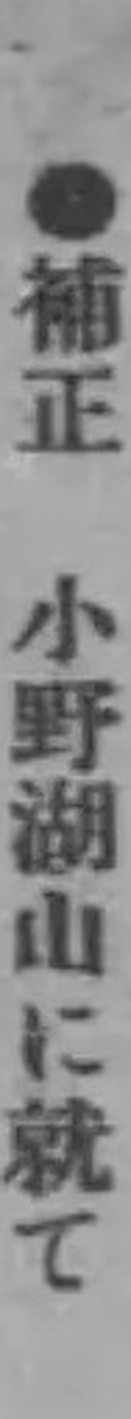●補正小野湖山に就て
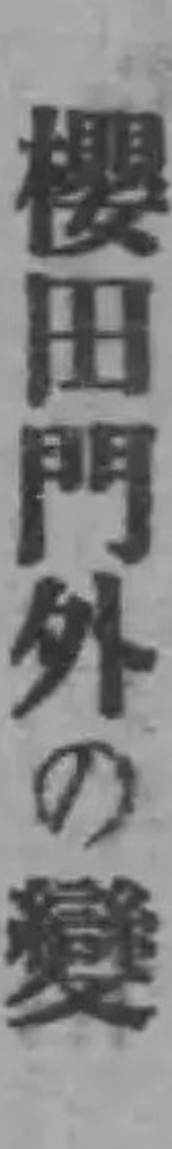桜田門外の変
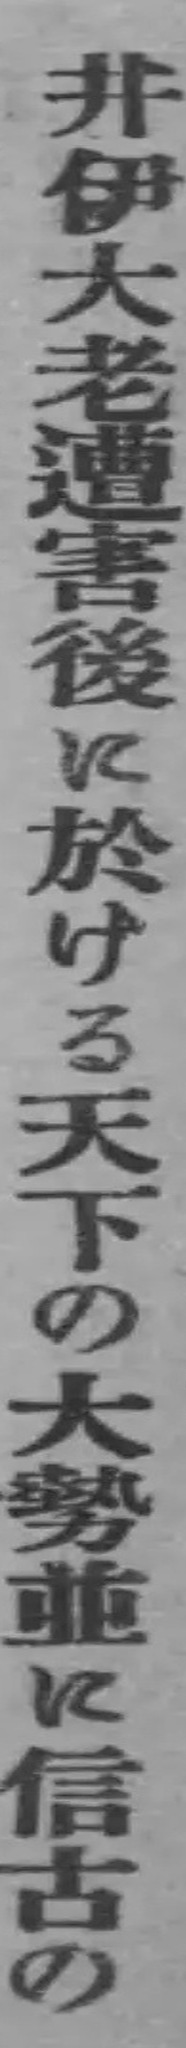井伊大老遭害後に於ける天下の大勢並に信古の
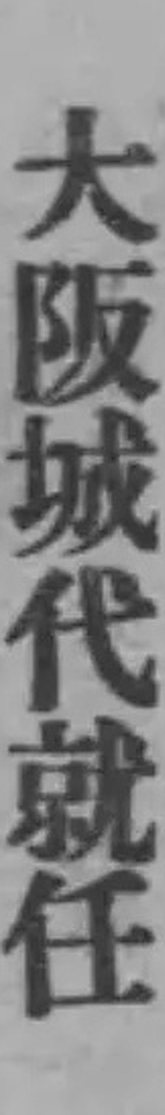大阪坂城代就任
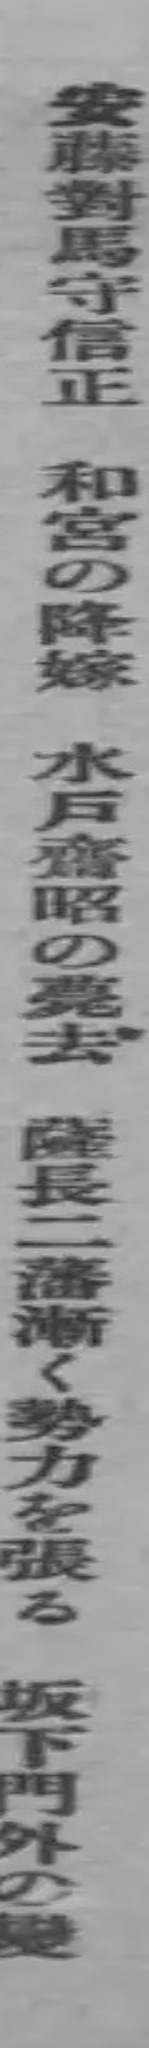安藤対馬守信正和宮の降嫁水戸斉昭の薨去薩長ニ藩漸く勢力を張る坂下門外の変
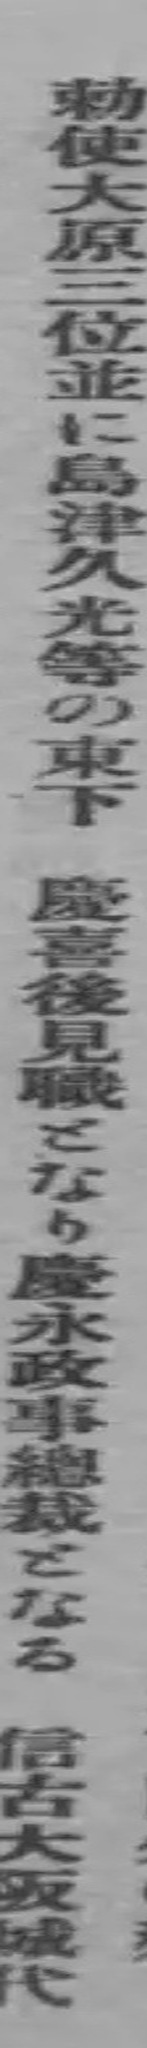勅使大原三位並に島津久光等の東下慶喜後見職となり慶永政事総裁となる信古大坂城代
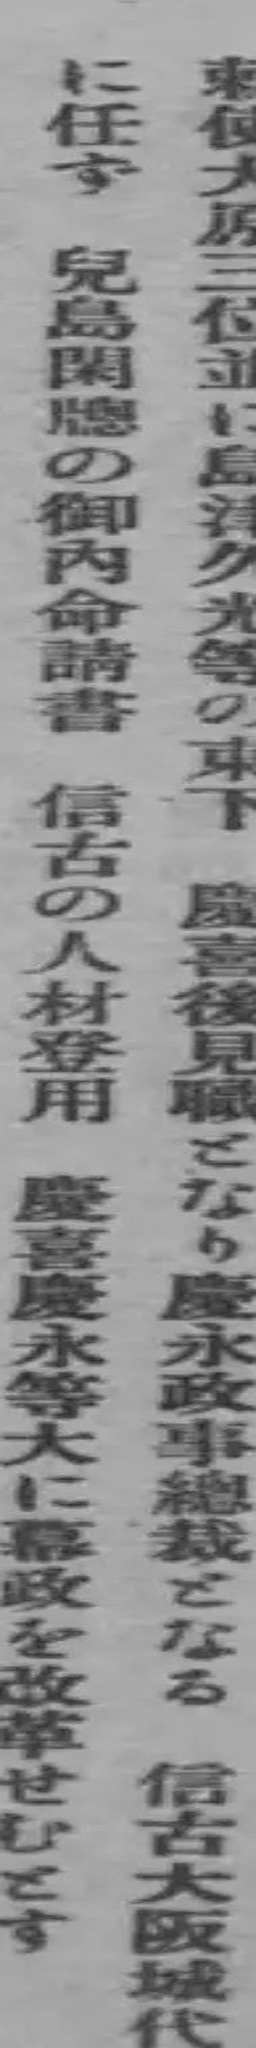に任ず児島閑牕の御内命請書信古の人材登用慶喜慶永等大に幕政を改革せむとす
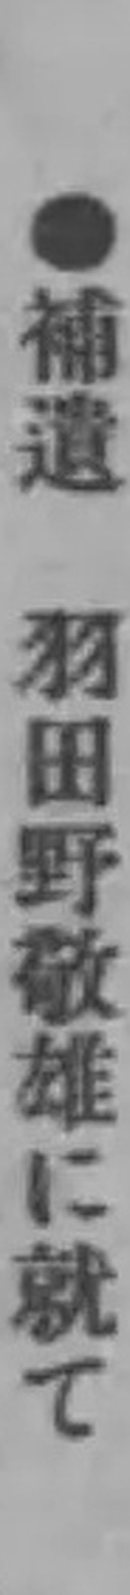●補遺羽田野敬雄に就て
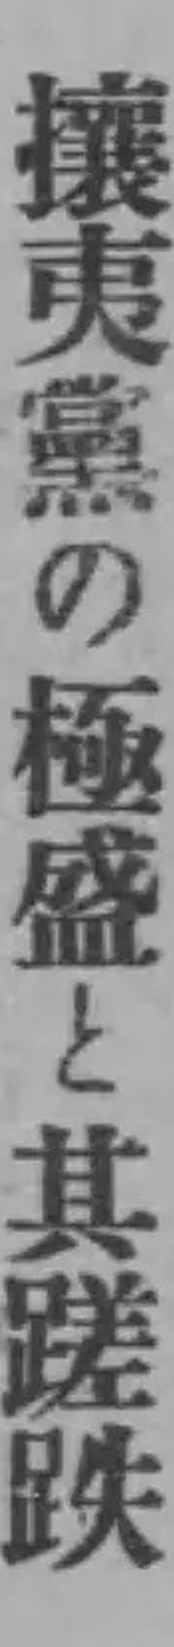攘夷党の極盛と其蹉跌
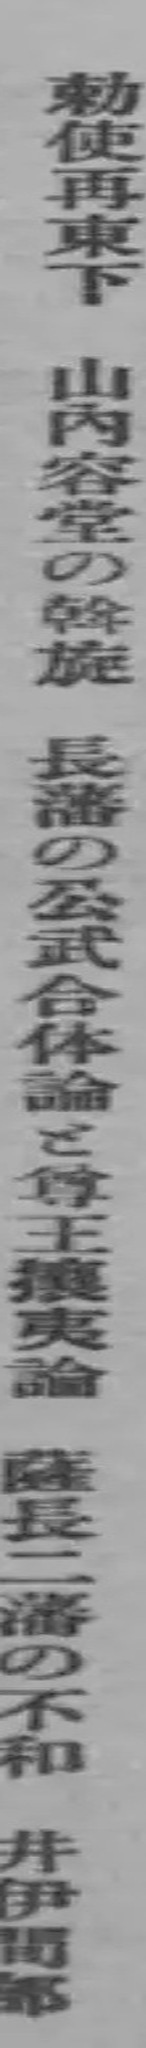勅使再東下山内容堂の斡旋長藩の公武合体論と尊王攘夷論薩長二藩の不和井伊間部
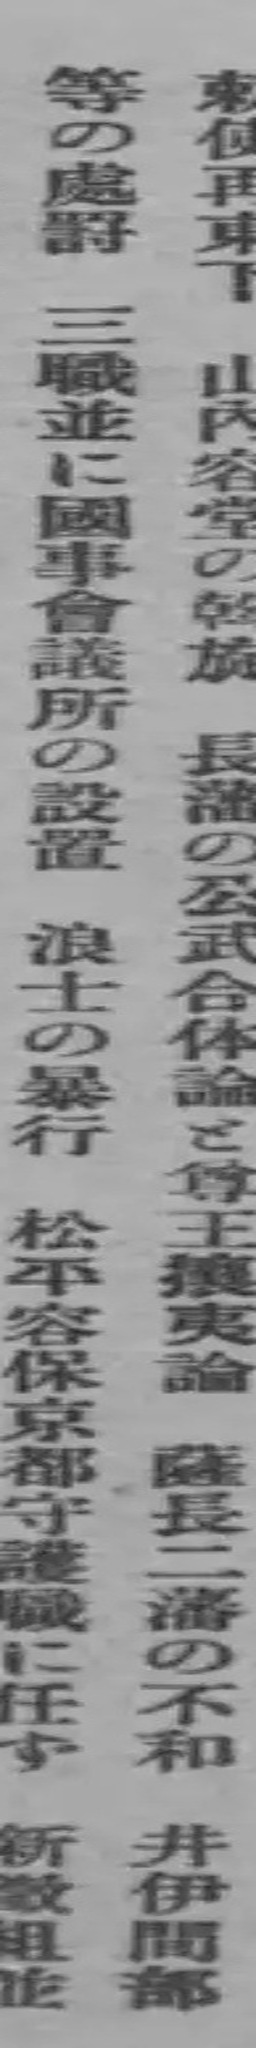等の処罰三職並に国事会議所の設置浪士の暴行松平容保京都守護職に任ず新微組並
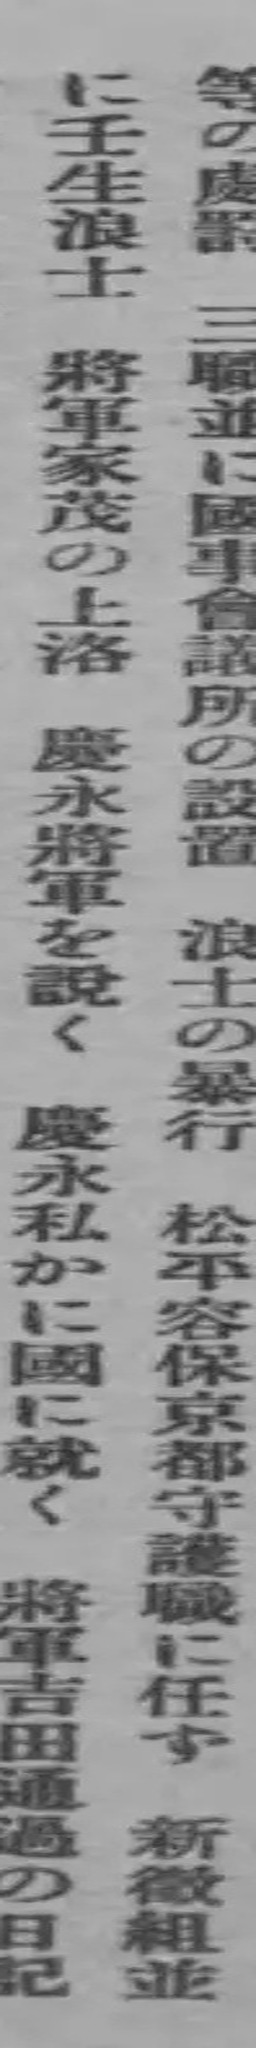に壬生浪士将軍家茂の上洛慶永将軍を説く慶永私かに国に就く将軍吉田通過の日記
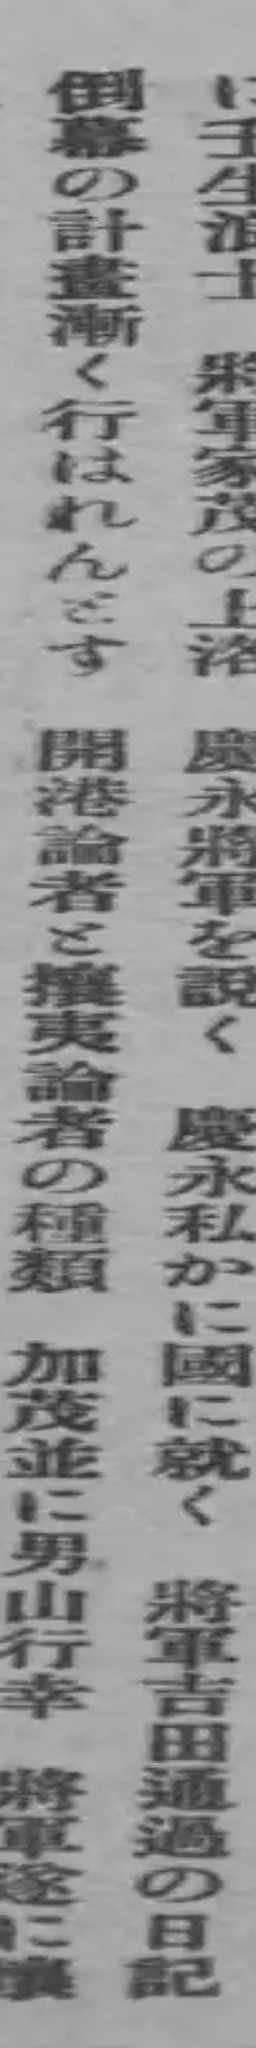倒幕の計画漸く行はれんとす開港論者と攘夷論者の種類加茂並に男山行幸将軍遂に攘
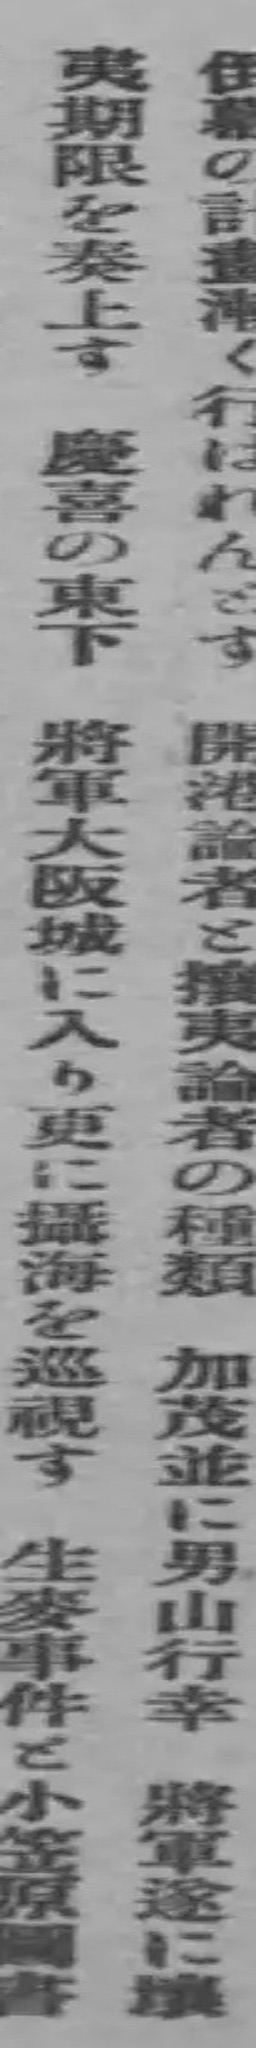夷期限を奏上す慶喜の東下将軍大阪城に入り更に摂海を巡視す生麦事件と小笠原図書
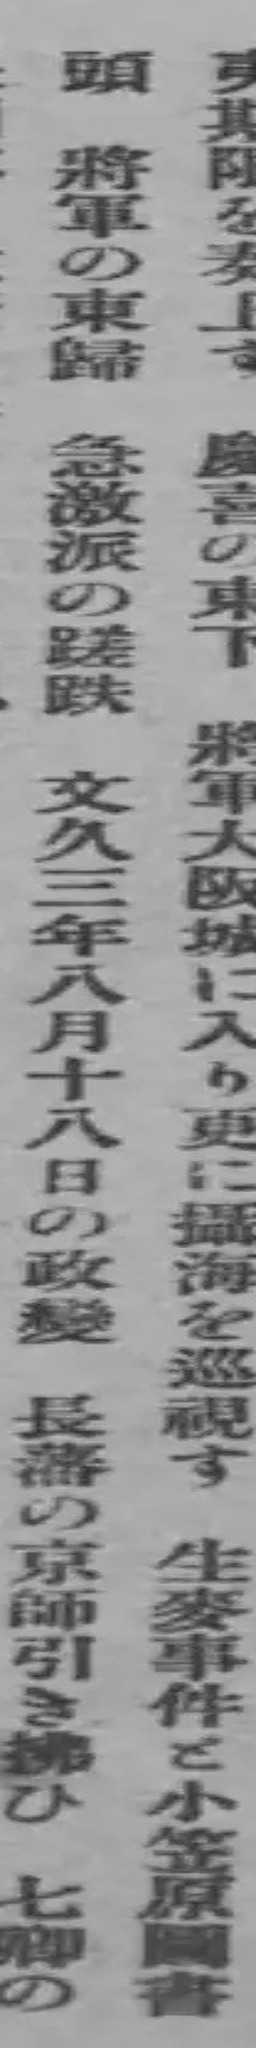頭将軍の東帰急激派の蹉跌文久三年八月十八日の政変長藩の京師引き払ひ七卿の
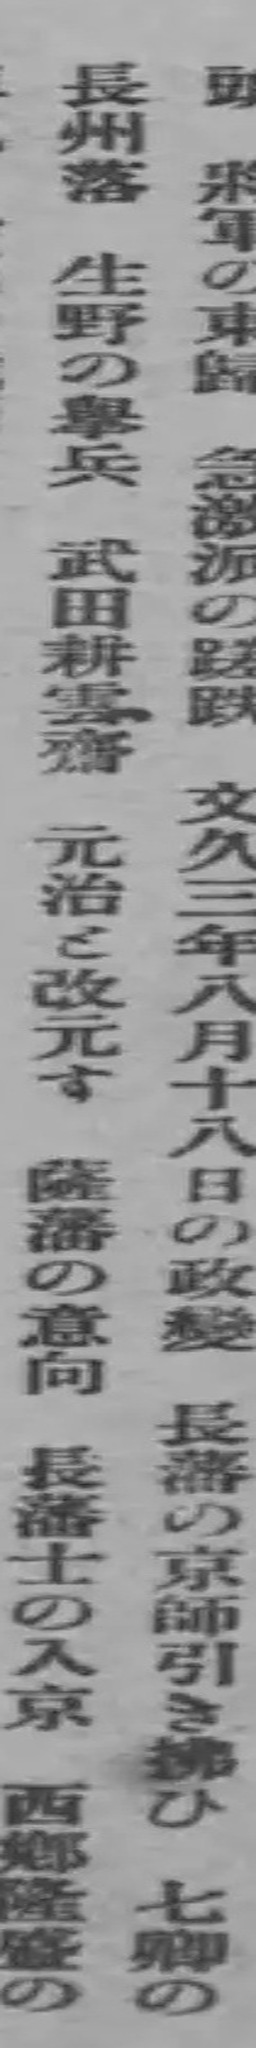長州落生野の挙兵武田耕雲斎元治と改元す薩藩の意向長藩士の入京西郷隆盛の
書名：豊橋市史談
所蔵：国立国会図書館 National Diet Library, JAPAN
